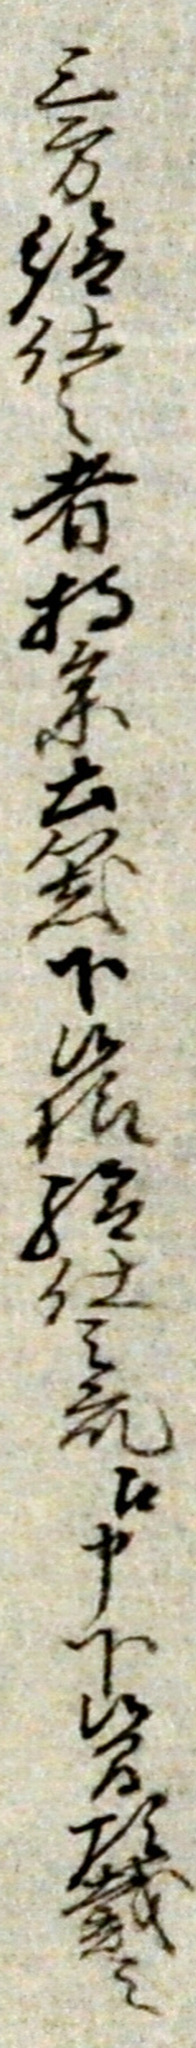三方給仕之者持参土器下候様給仕之衆江申下候間頂戴之
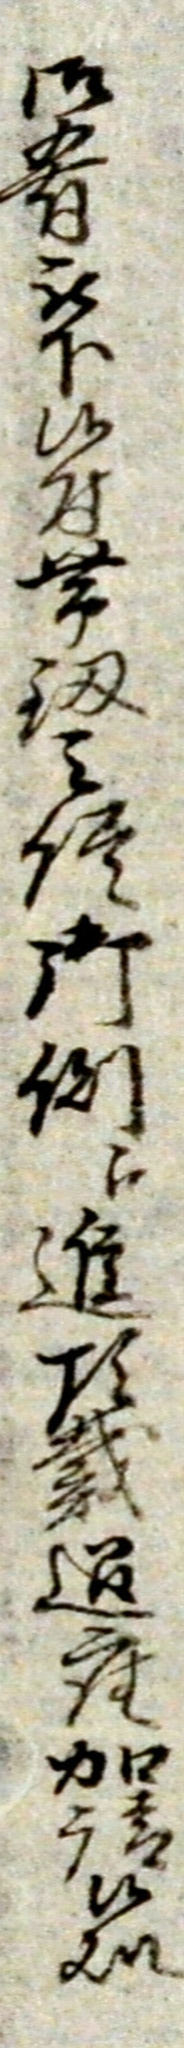御被下候付帯劔之御側江進頂戴退座加請候処
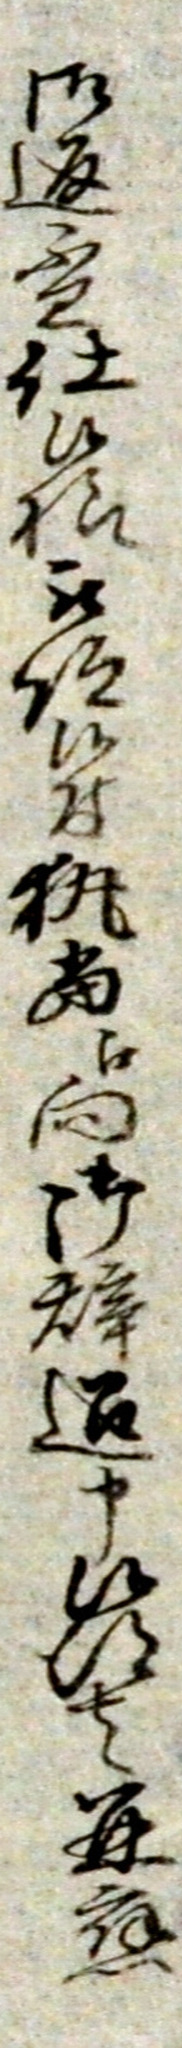御返盃仕候様被仰候付執當江向御辞申候江者再応
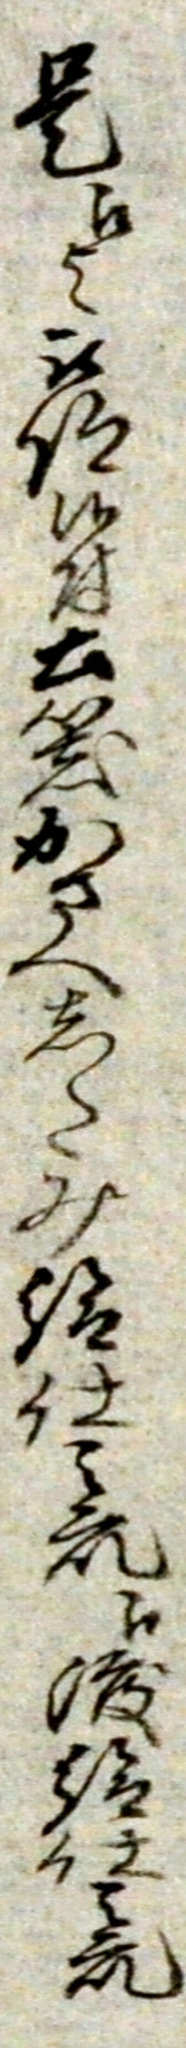是江与被仰候付土器かさへ志たみ給仕之衆江渡給仕之衆
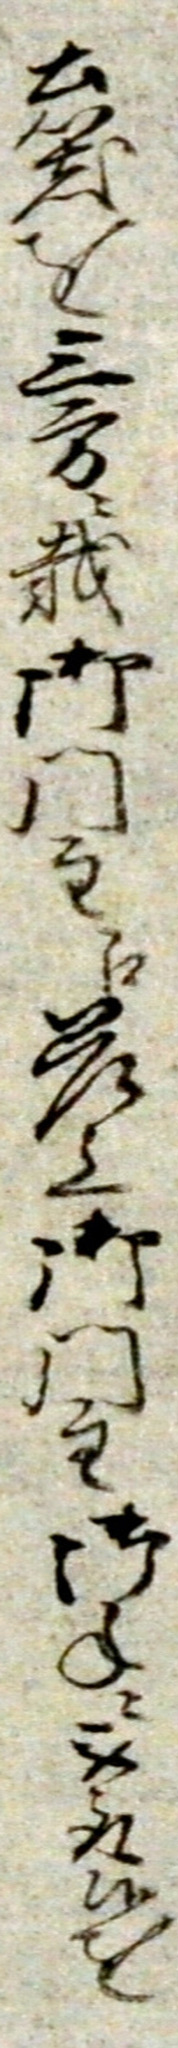土器を三方ニ載御門主江差上御門主御手ニ被取候を見受
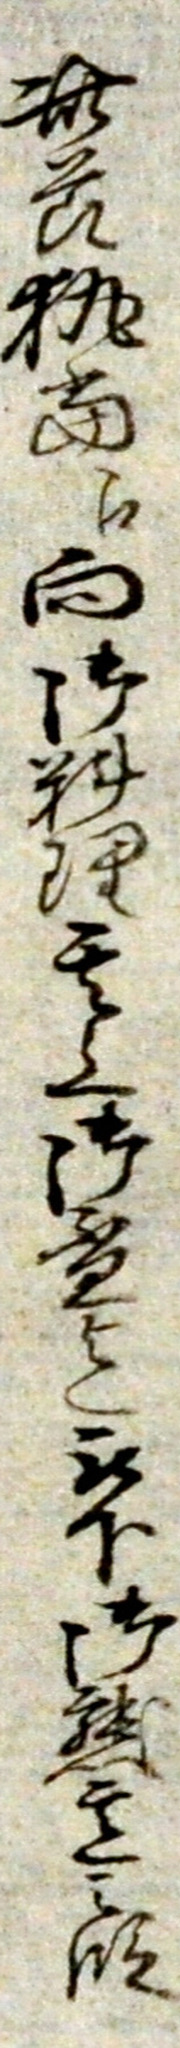此節執当江向御料理其上御昼迄被下御懇意之段
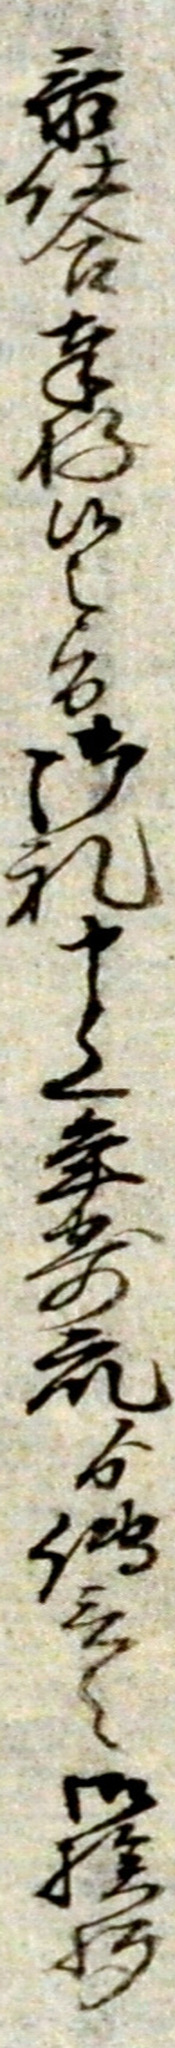置仕合奉存候之旨御礼申上年寄衆ゟ伝言之御挨拶
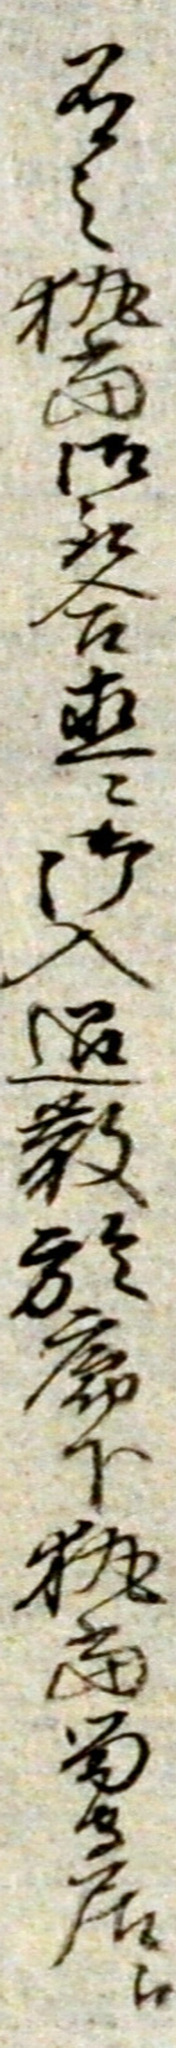有之執当御取合直ニ御入退散於廊下執当留守居江
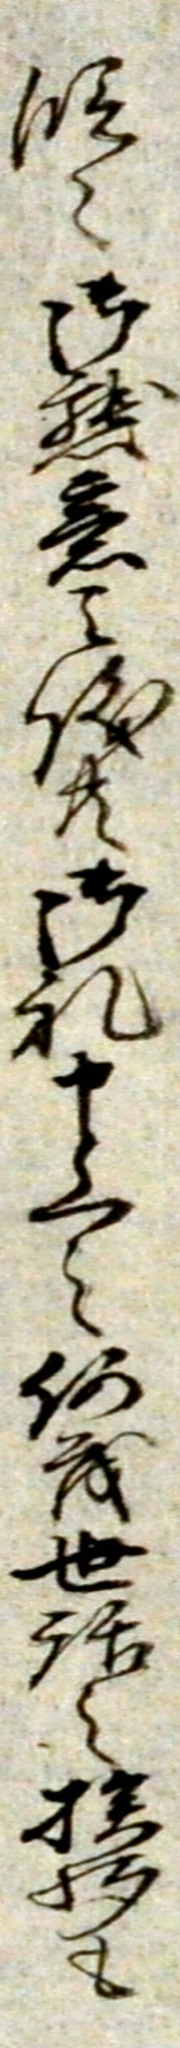段々御懇意之儀共御礼申上之何も世話之挨拶も
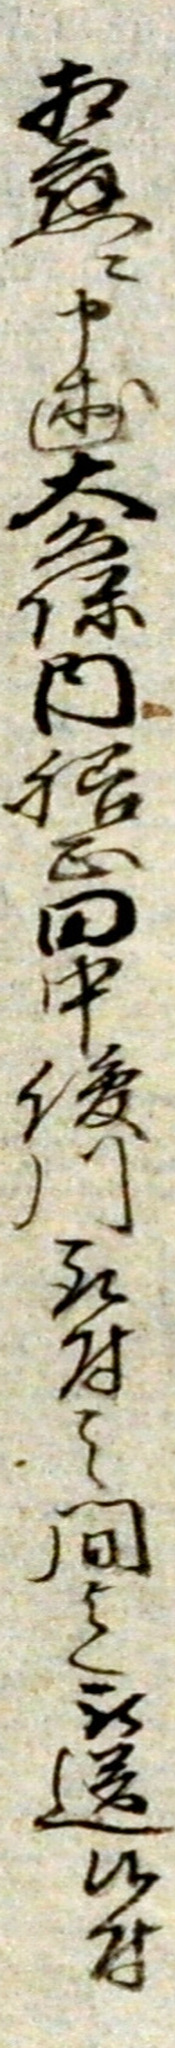相応ニ申述大久保内膳正田中俊川取付之間迄被送候付
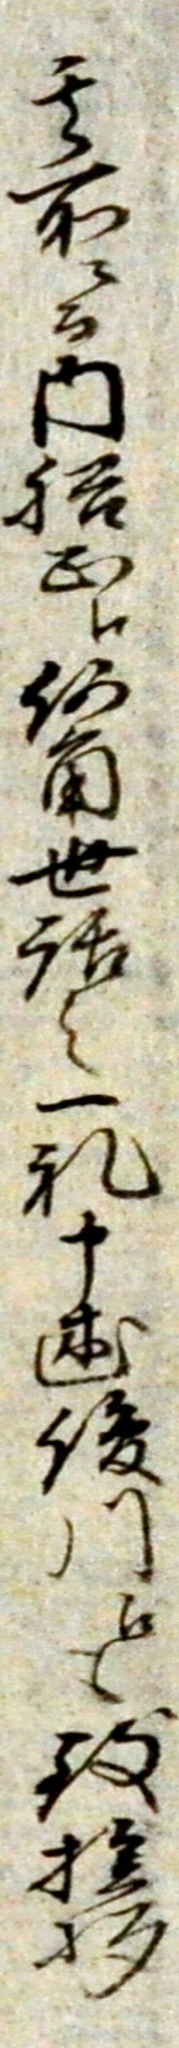其所ニ而内膳正江何角世話之一礼申述俊川江も致挨拶
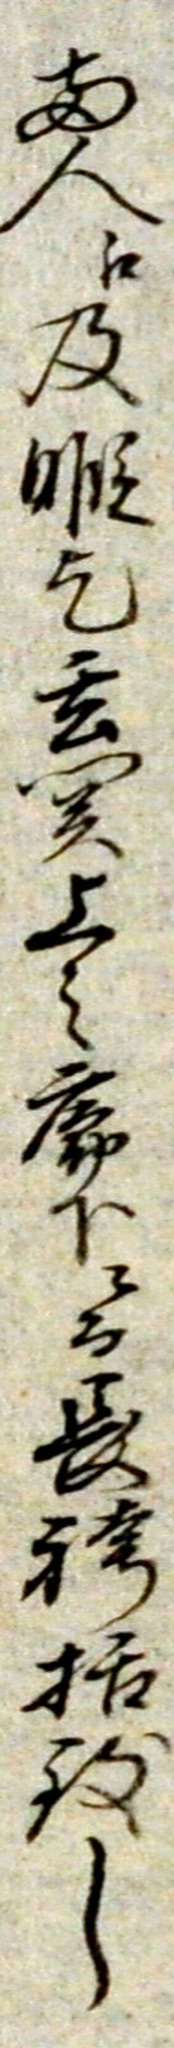両人江及暇乞玄関上之廊下ニ而長袴据致し
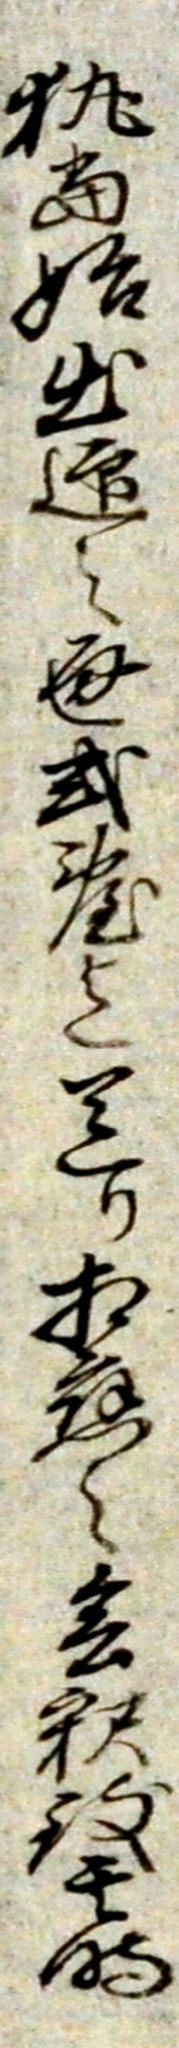執当始出迎之通式台迄送り相応之会釈致其時
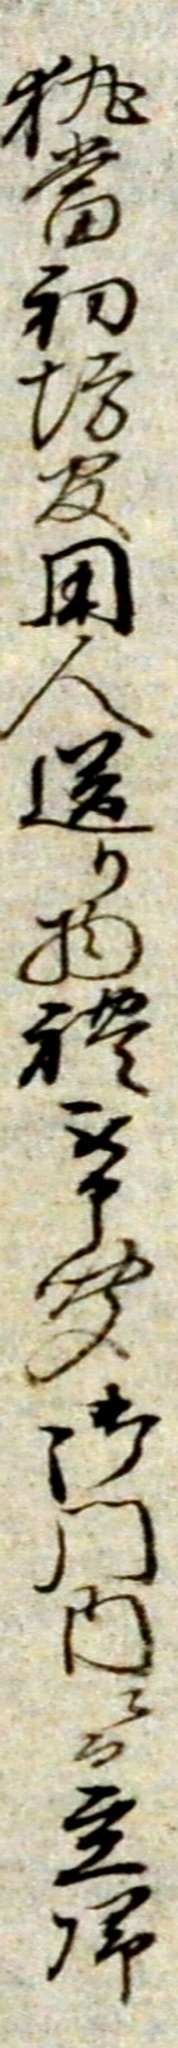執当初坊官用人送り拝礼被申聞御門内ニ而立帰
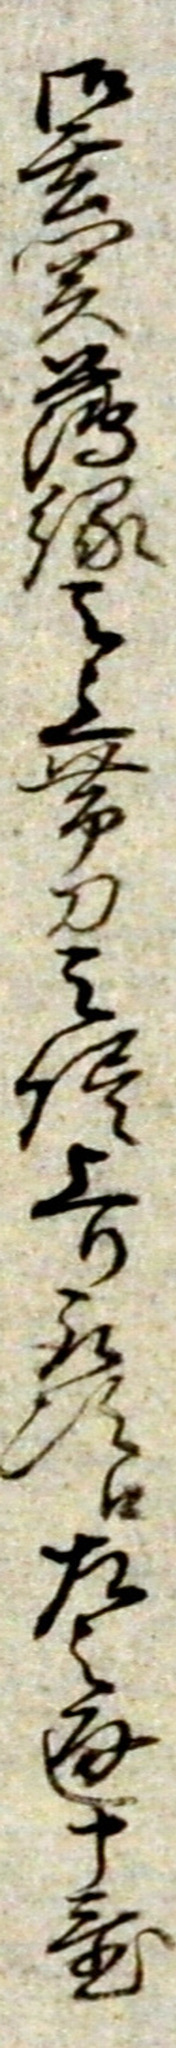御玄関縁之上帯刀其儘上り取次江左之通申置
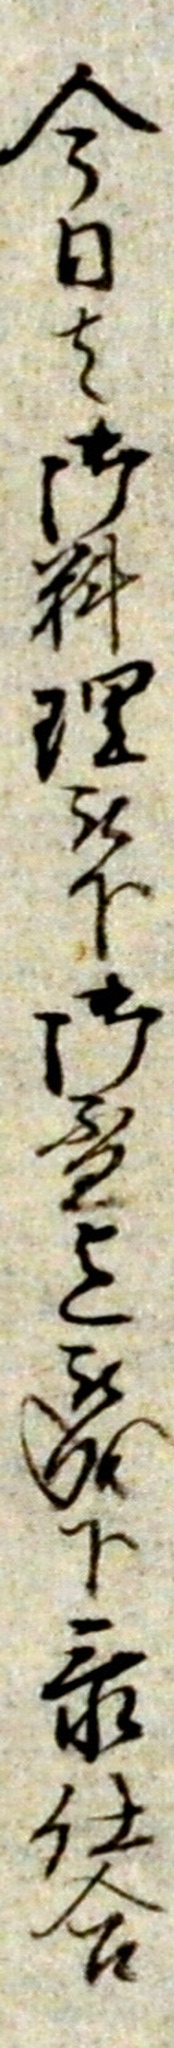今日者御料理被下御盃迄被成下置仕合
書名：日光御名代相勤候節ノ留
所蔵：伊那市立高遠町図書館・合同会社AMANE
